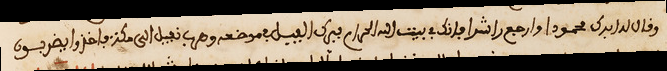وقال له ابرك محمودا وارجع راشدا فانك في بيت الله الحرام ببرك الفيل في موضعه وهرب نفيل الى مكة فاخذوا يضربون
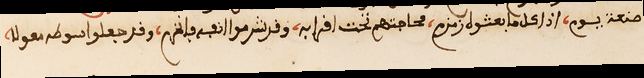صنعة يوم اذا كل ما بعثوه زمزم محاجتهم تحت اقرابه وقد شرموا انفه فانخرم وقد جعلوا سوطه معولا
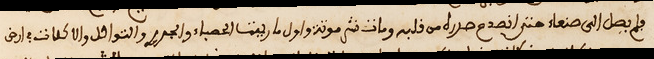فلم يصل الى صنعاء حتى انصدع صدره من قلبه ومات شر موتة واول ما ربيت الحصباء والجررى والتوالل والاكلات في ارض
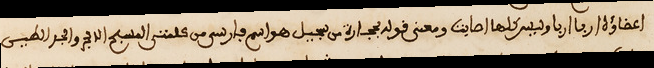اعضاؤه اربا اربا وليس كلها اصابت ومعنى قوله بحجارة من سجيل هو اسم فارسى من كلمتى المسبح الامجر وامجد الطين
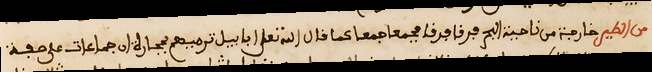من الطير خارجة من ناحية البحر فرقا فرقا فجمعا جمعا كما قال الله تعلى ابابيل ترهيهم بحجارة ان جماعات على صفة
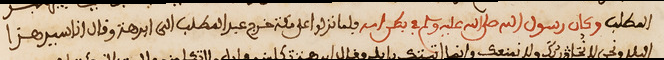المطلب وكان رسول الله صلى الله عليه وسلم في بطن امه فلما نزلوا على مكة خرج عبد المطلب الى ابرهة وقال انا سيد هذا
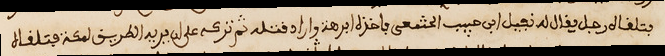فتلقاه رجل يقال له نفيل ابن حبيب الحثمعى فاخذه ابرهة واراد قتله ثم تركه على ان يريه الطريق لمكة فتلقاه
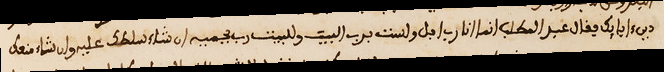دين ءبايك فقال عبد المطلب انما انا رب ابل ولست برب البيت وللبيت رب يحميه ان شاء سلطك عليه وان شاء منعك
